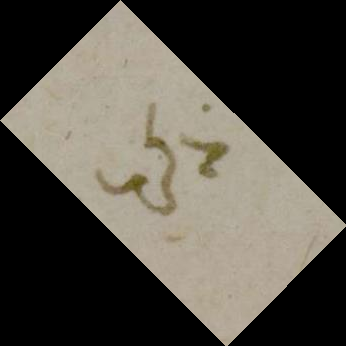ذكرن
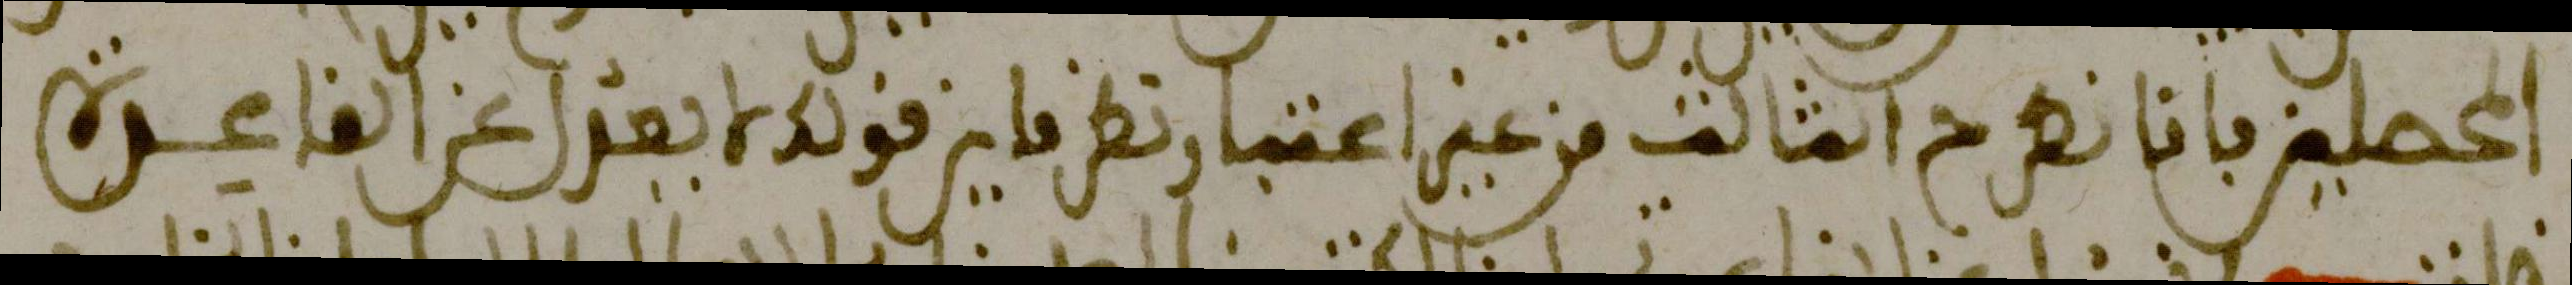المحصلين فانا نطرح الثالث من غير اعتبار نظر فاين قولك لا يعدل عن القاعِدة
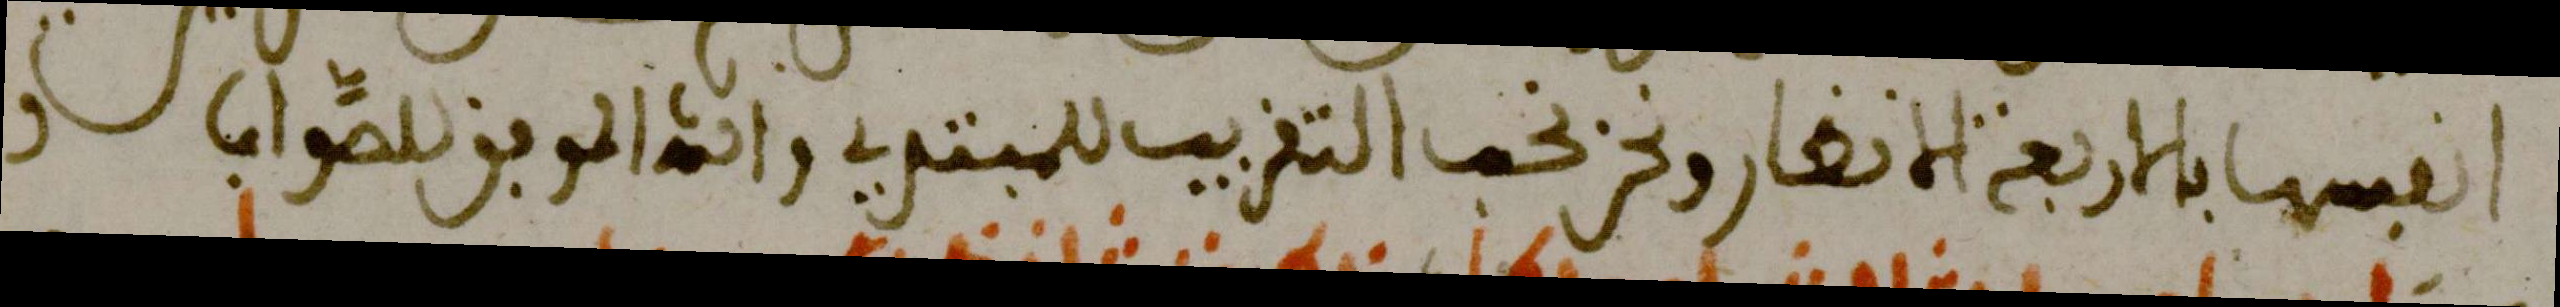انقسها بالاربعة الانظار ونحن نحب التقريب للمبتدي والله الموفق للصَّواب
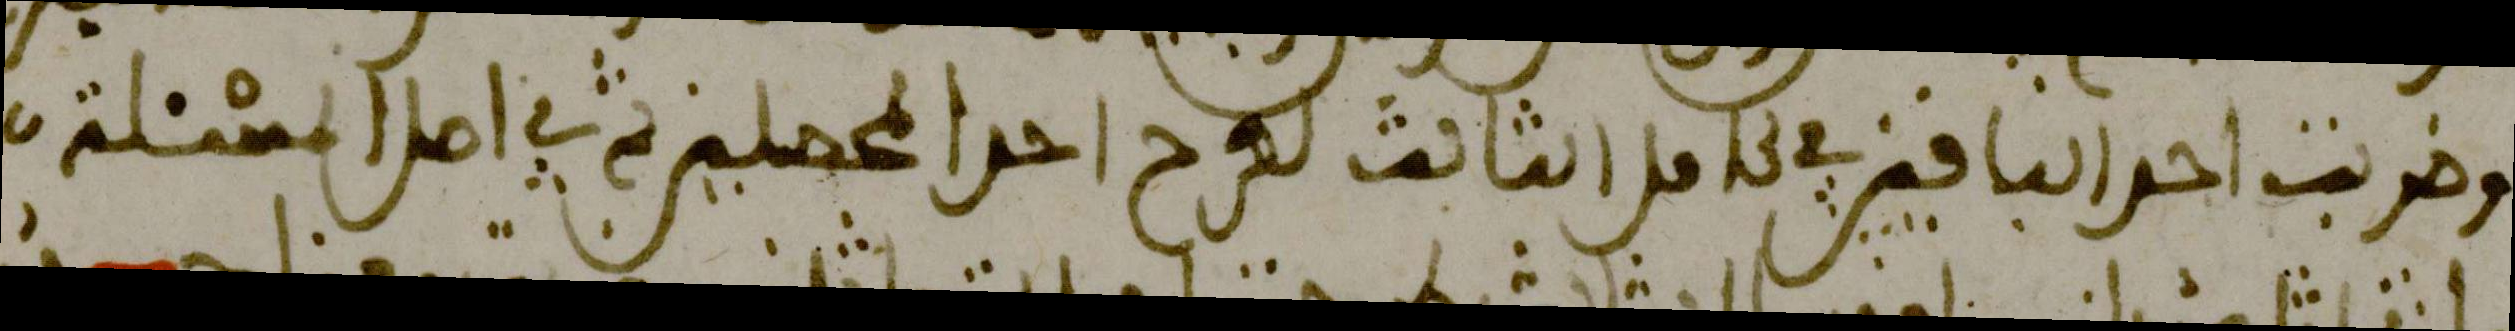وضربت احد الباقيين في كامل الثالث لطرح احد المحصلين ثم اصل المسْئلة
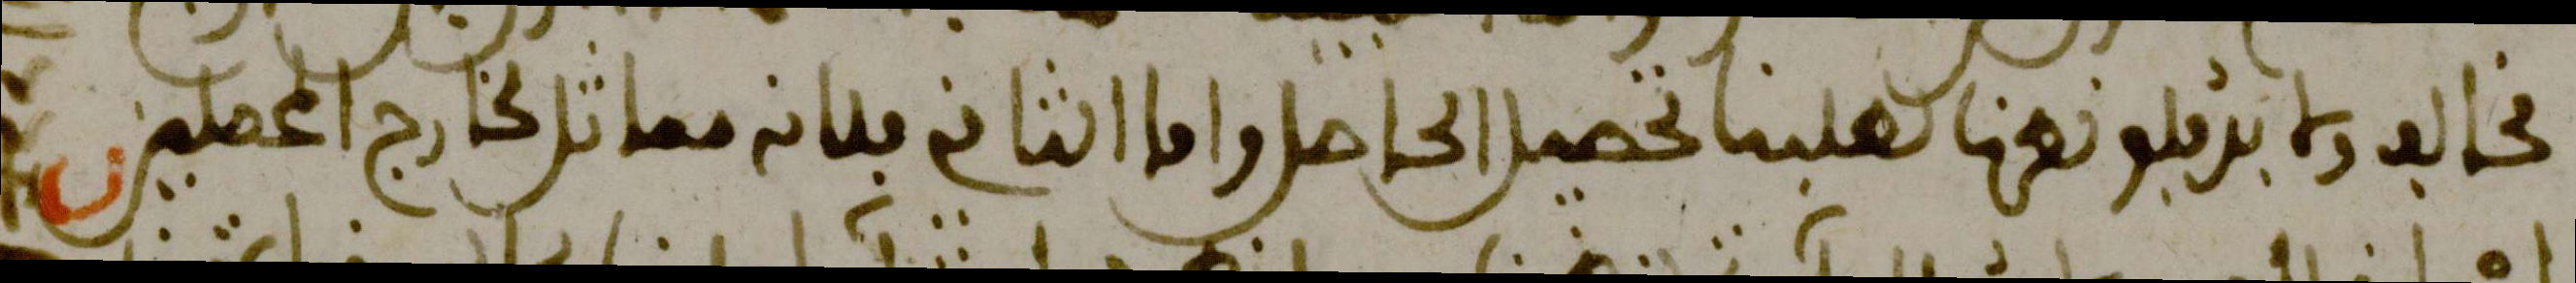مخالف ولا بد فلو نظرن لطلبنا تحصيل الحاصل واما الثاني فلانه مماثل لخارج المحصلين
